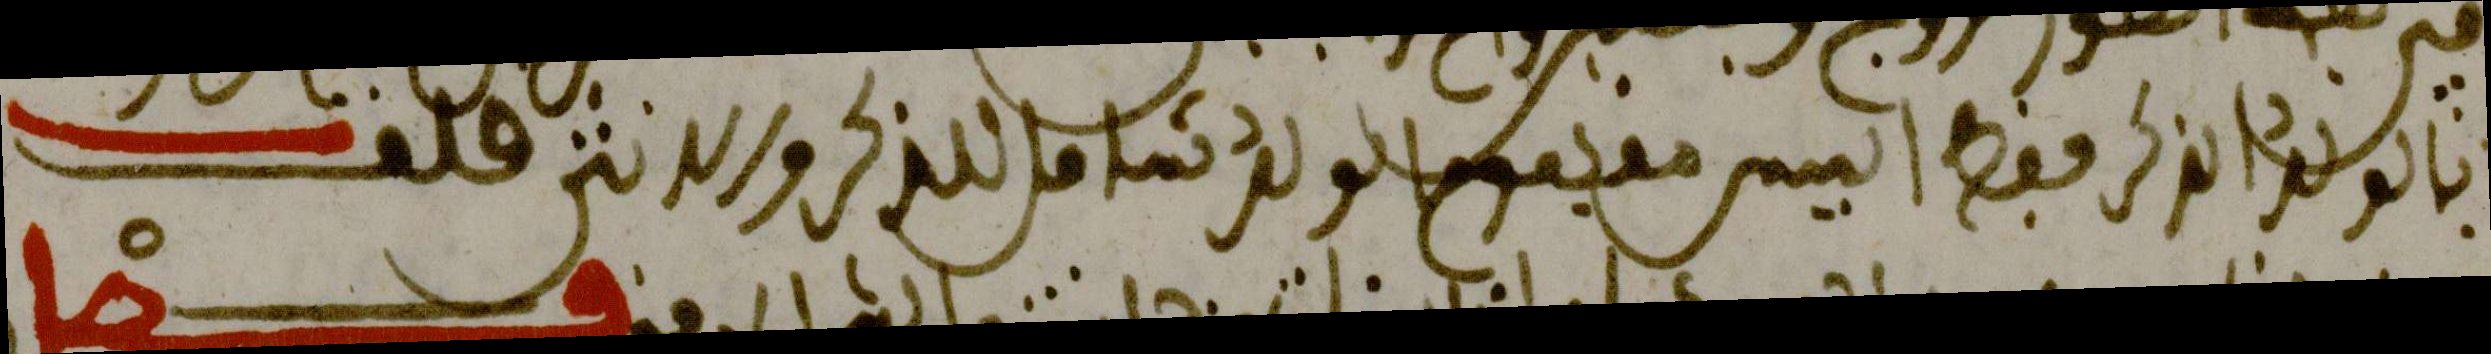بالولد الذكر فقط اليس مفهوم الولد شامل للذكر والانثى قلتَ
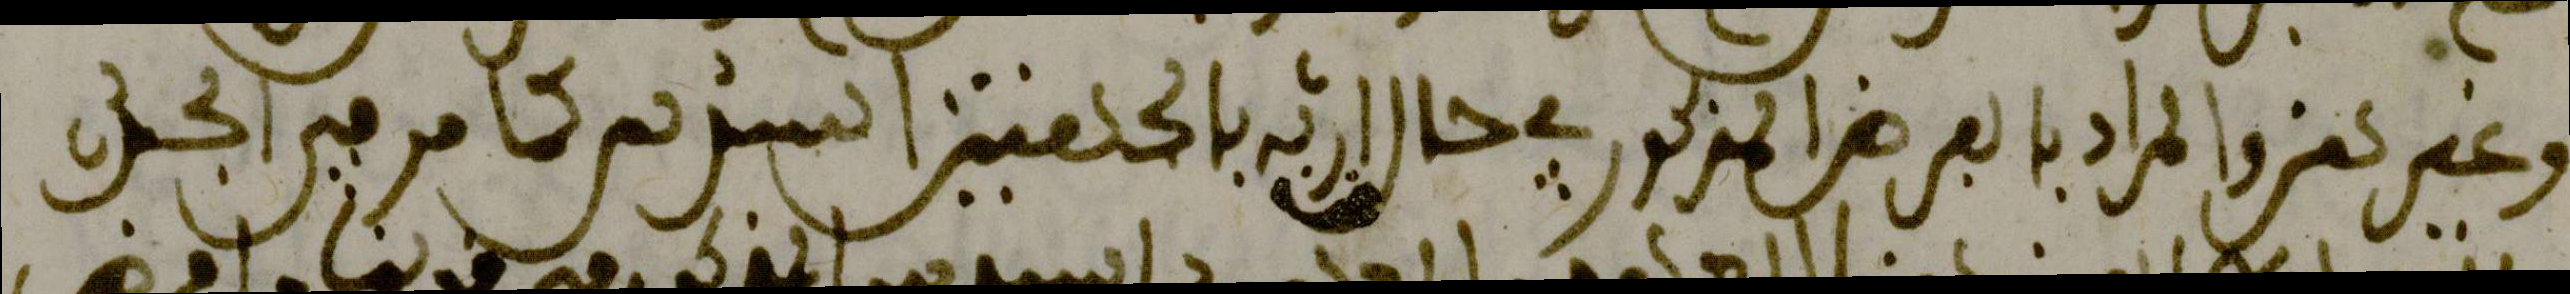وغيرهن والمراد بالفرض المذكور رفي حال ارثه بالجهتين السدس كما مر في الجد
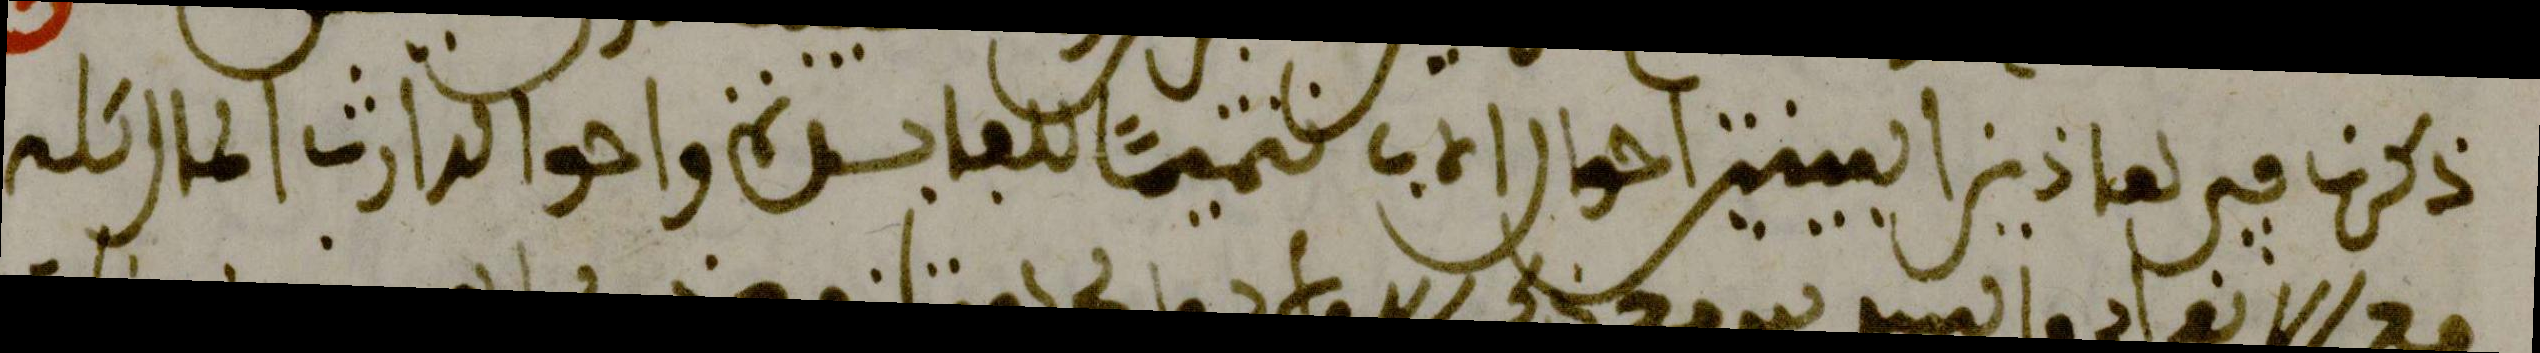ذكرن في هذين البيتين احوال الاب تتميمًا للفايدة واحواله ارث المال كله
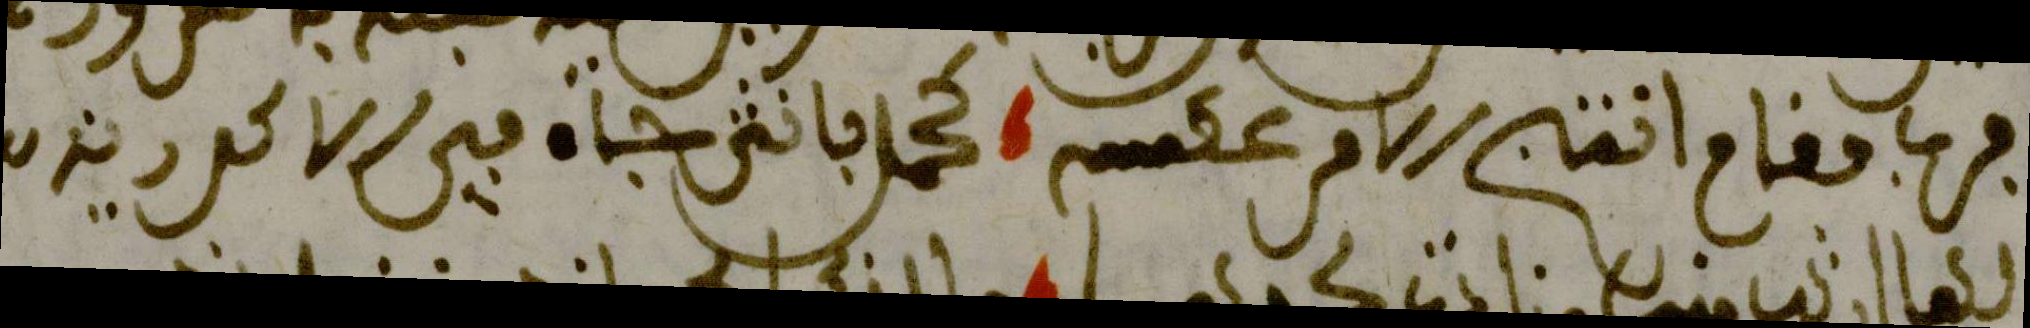فرب مقام انتج الامر عكسه كحمل بانثى جاء في الاكدرية
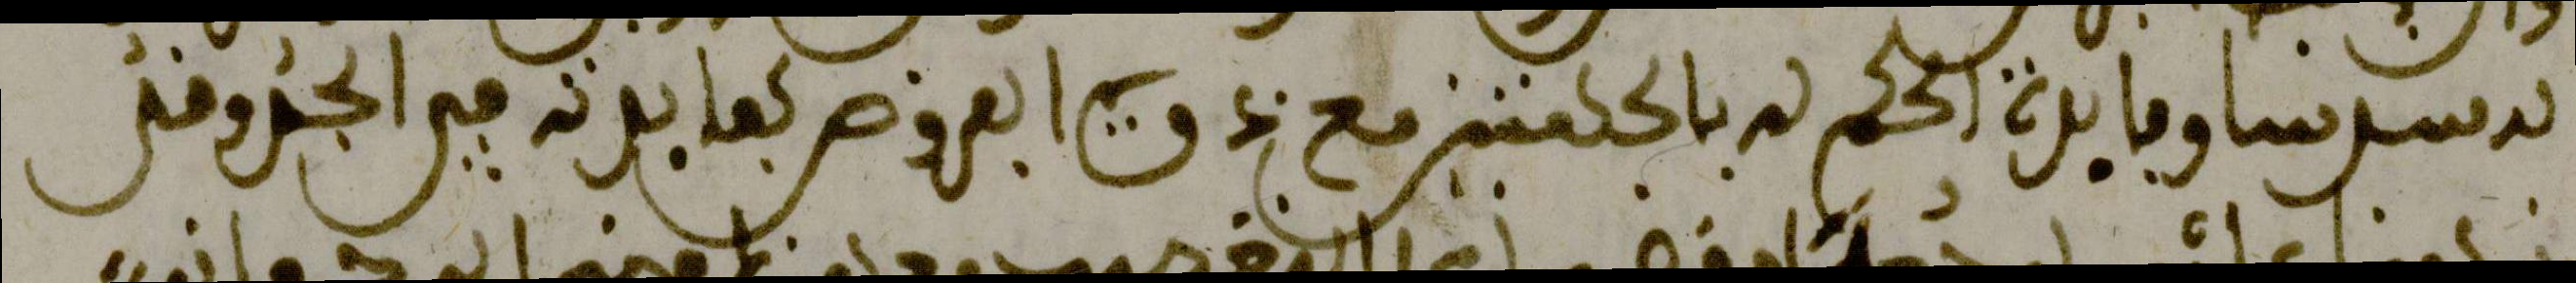له سدسا وفائدة الحكم له بالجهتين مع ذوي الفروض كفائدته في الجد وقد
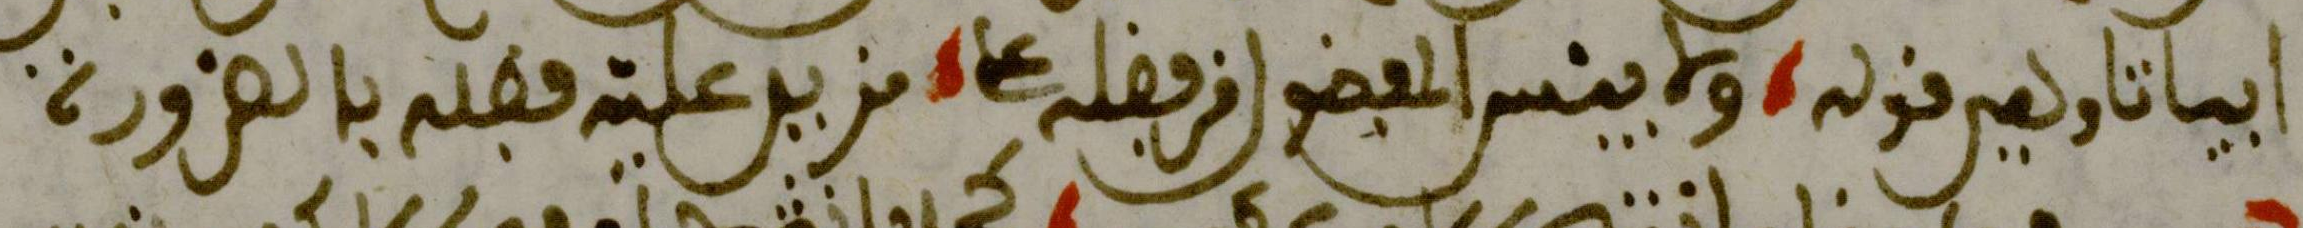ابياتا وهي قوله ولا ييئس المفضول من فضله على مزيد عليْه فضله بالضرورة
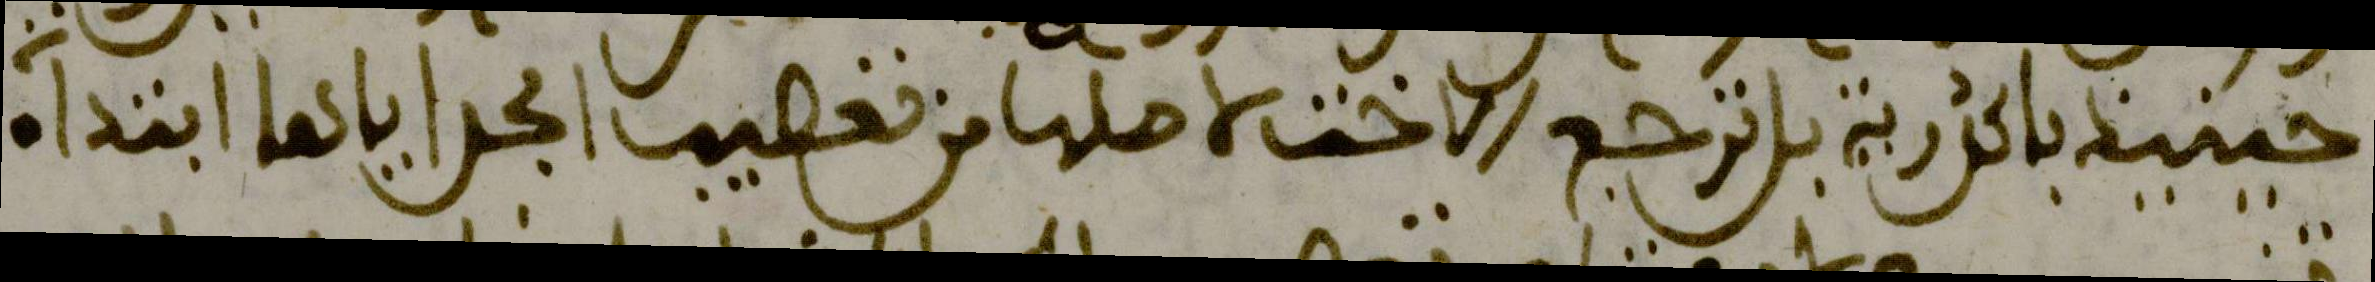جينيذ باكدرية بل ترجع الاخت لاصلها من تعصيب الجد اياها ابتداء
